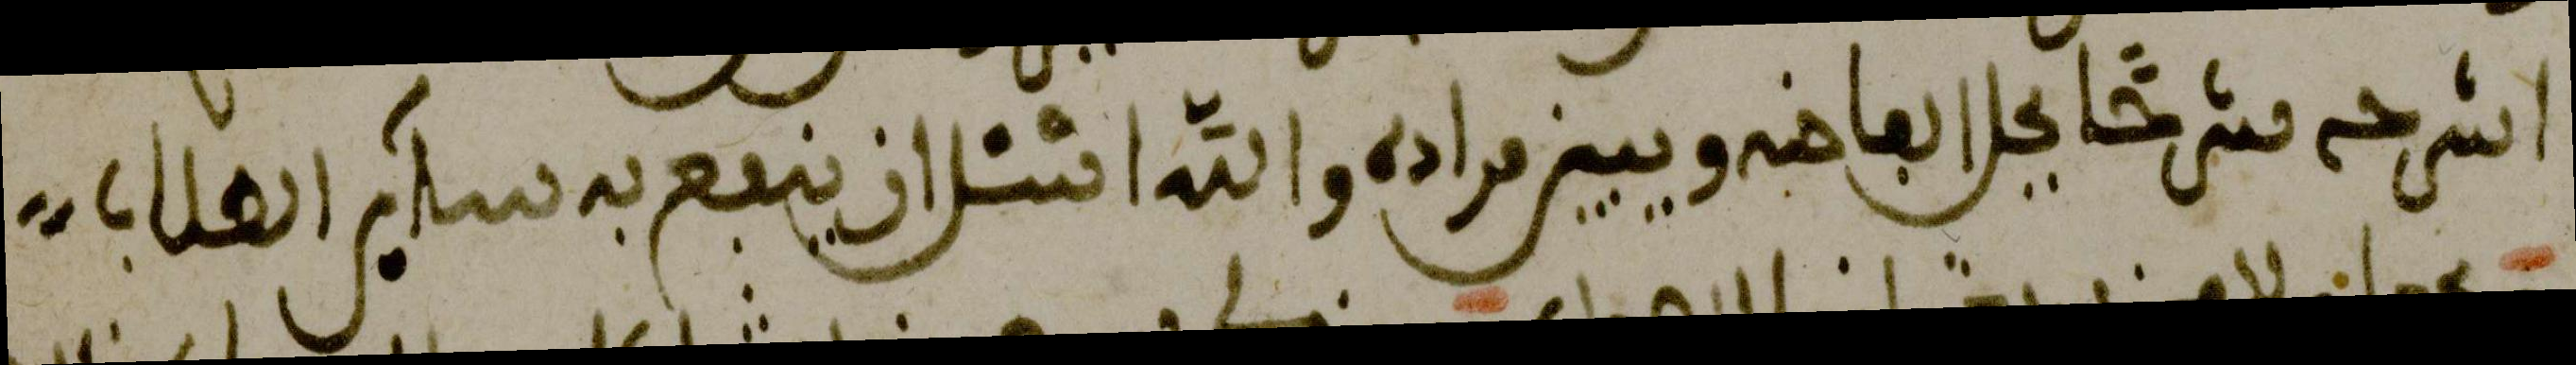اشرحه شرحا يحل الفاضه ويبين مراده والله اسئل ان ينفع به سائر الطلاب
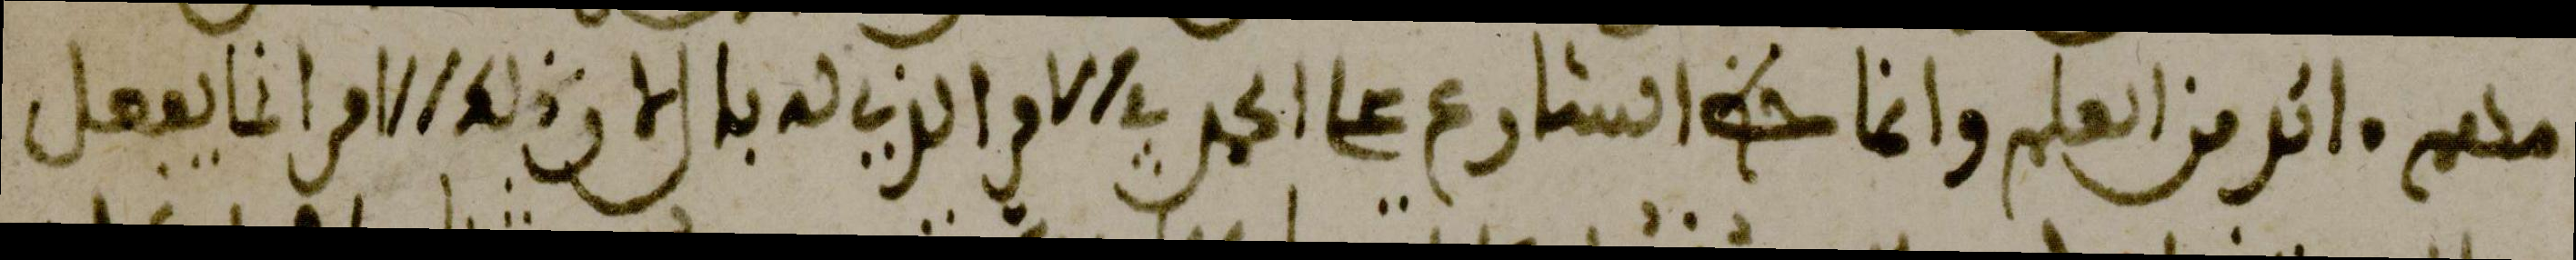مهم ءاكد من العلم وانما حظ الشارع على الحمد في الامر الذي له بال لان ذلك الامر انما يفعل
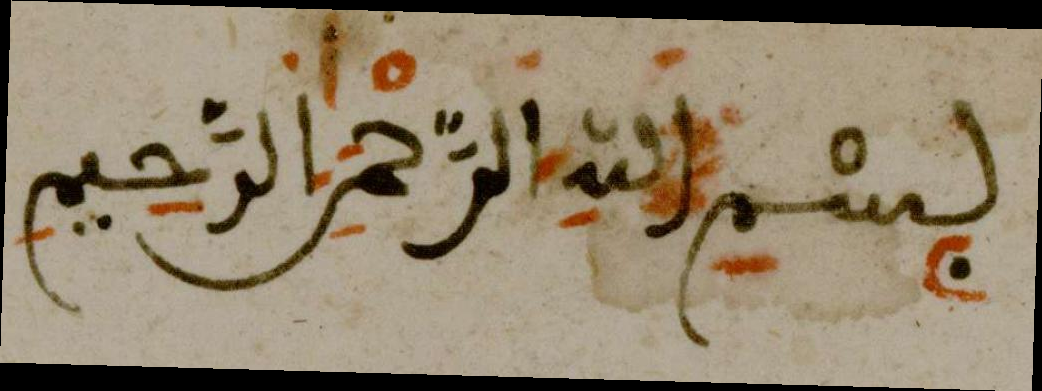بسم الله الرّحمن الرّحيم
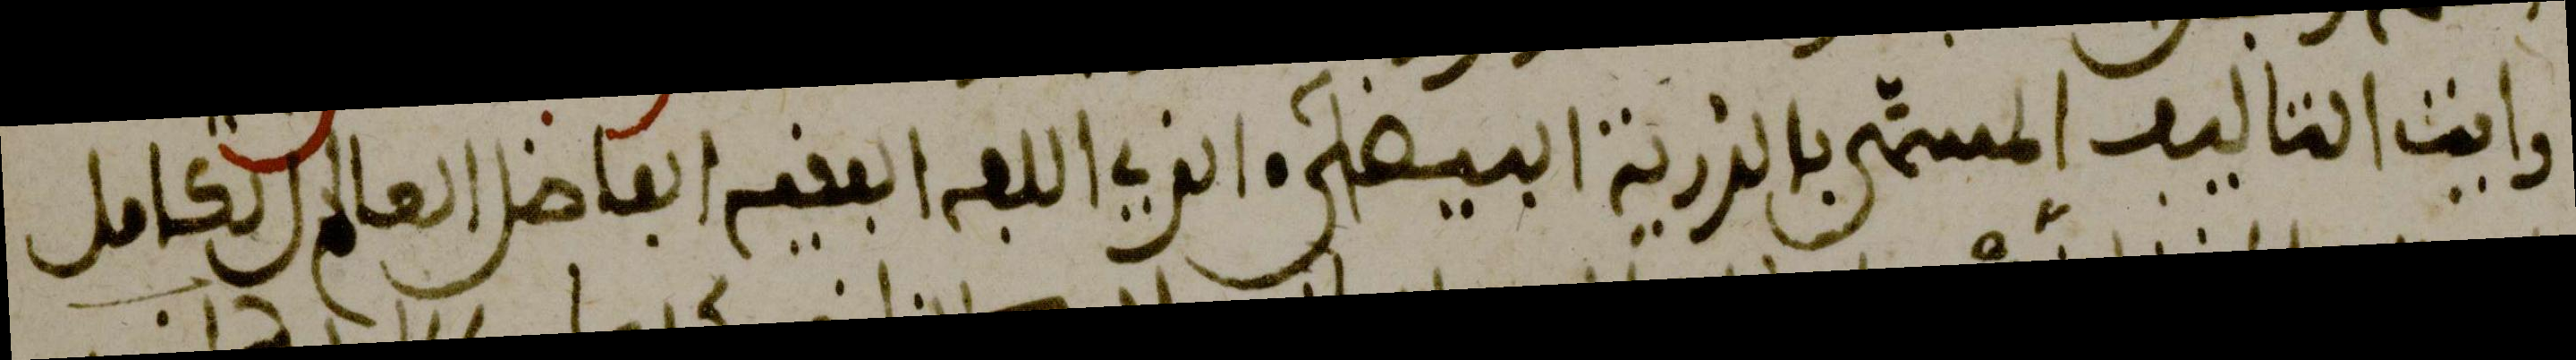رايت التاليف المسمّى بالدرية البيضىء الذي اللفه الفقيه الفاضل العالم الكامل
